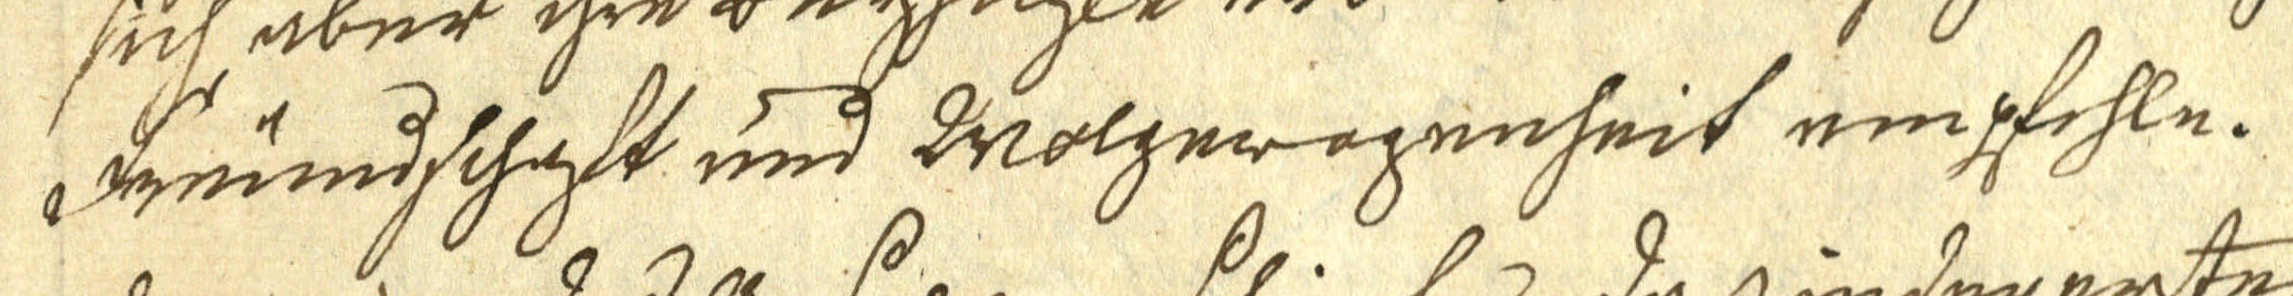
Freundschaft und Wolgewogenheit empfehle.
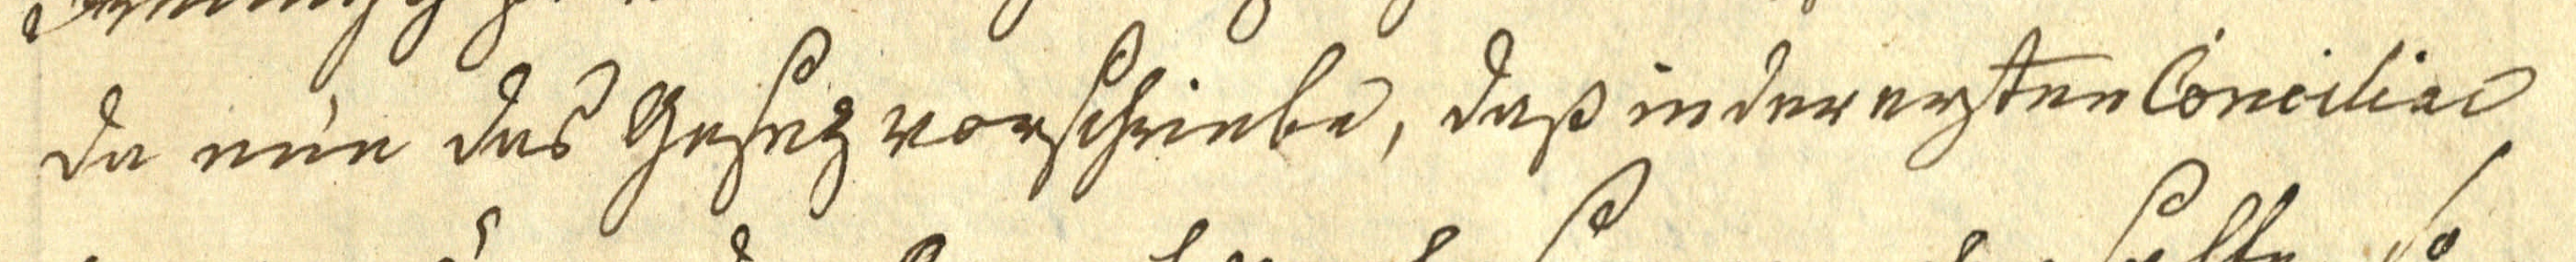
Da nun das Gesez vorschriebe, daß in der ersten Conciliar
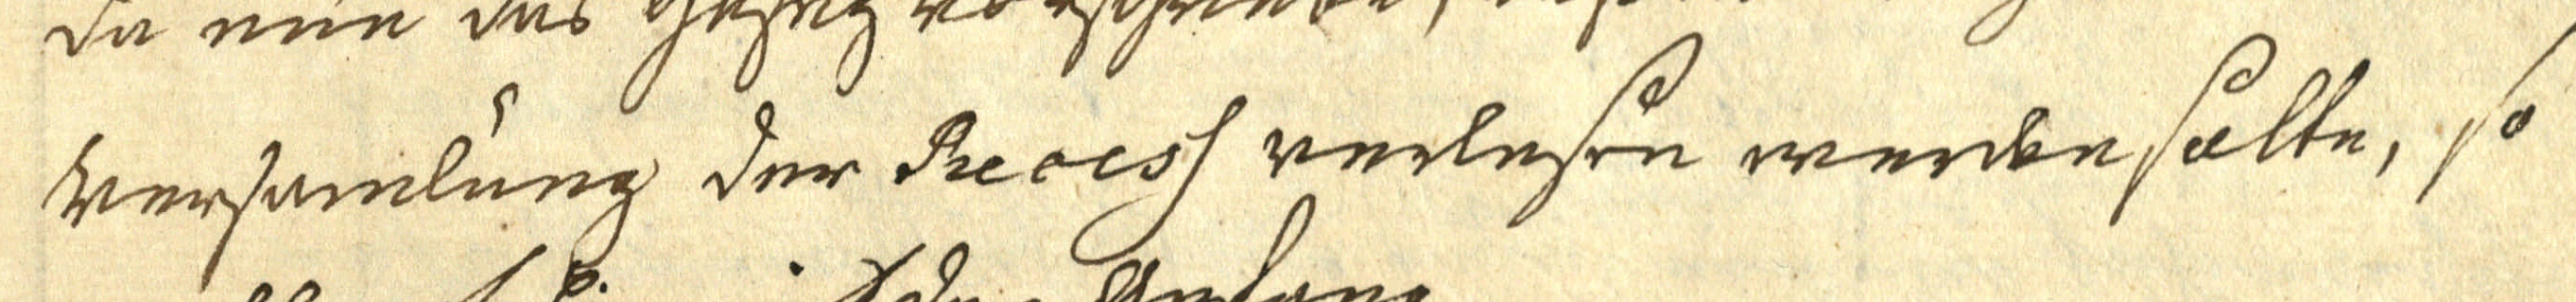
Versamlung der Recess verlesen werden solte, so
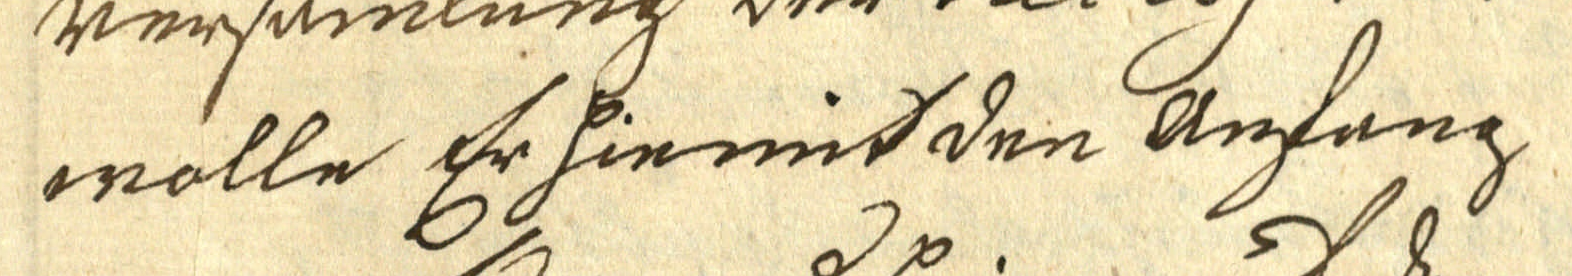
wolle Er hiemit den Anfang
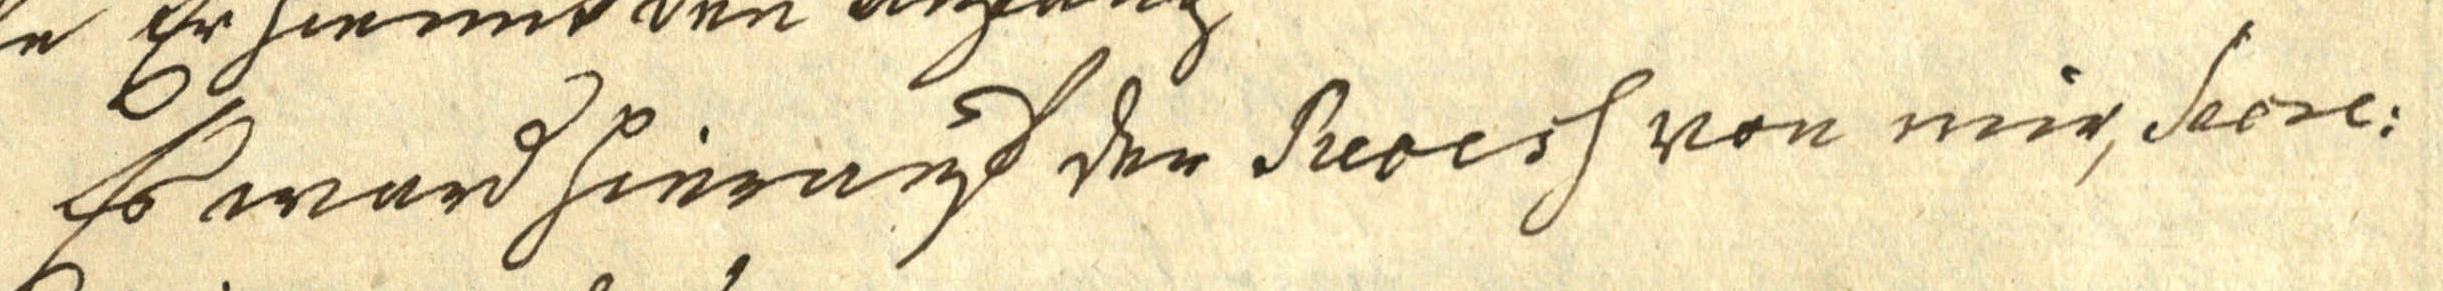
Er ward hierauf der Recess von mir Secre¬
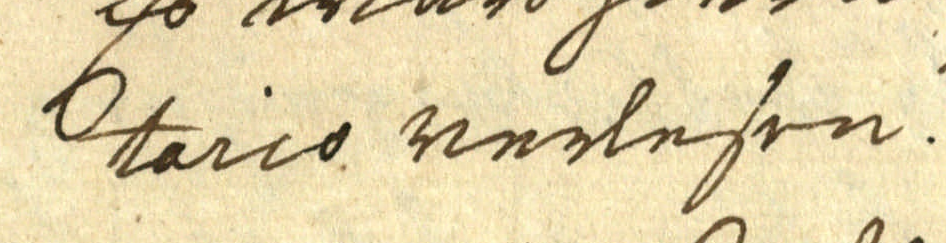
torio verlesen.
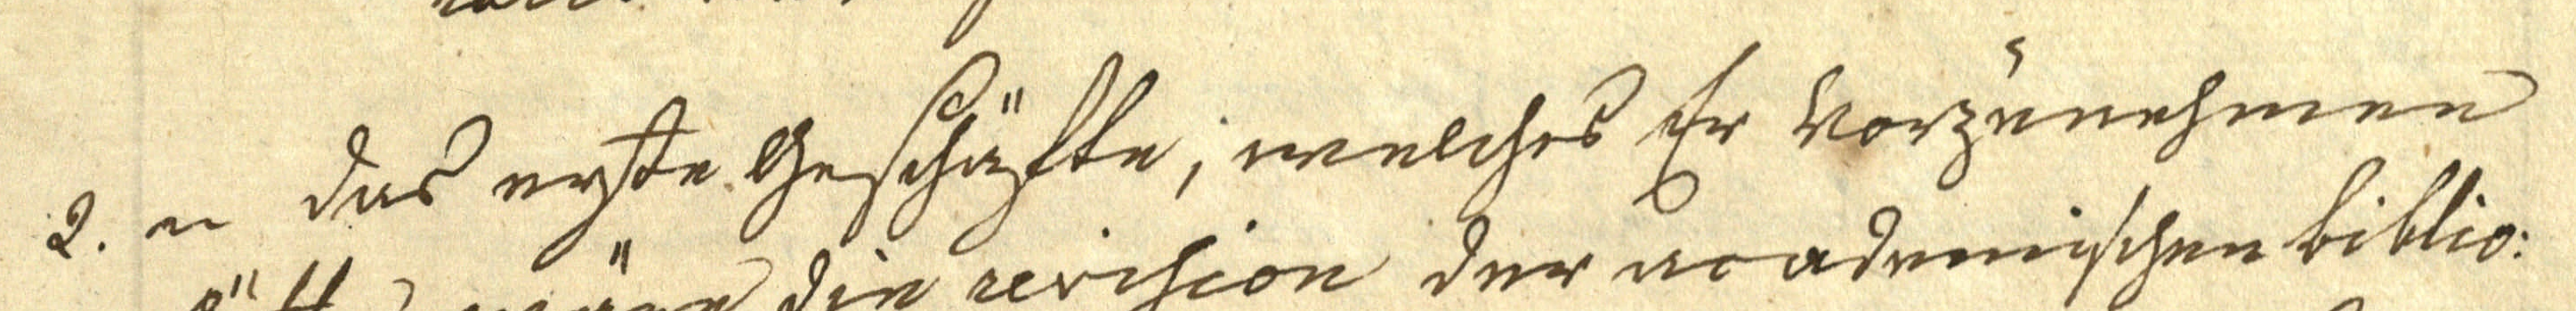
2. das erste Geschäfte, welches Er vorzunehmen
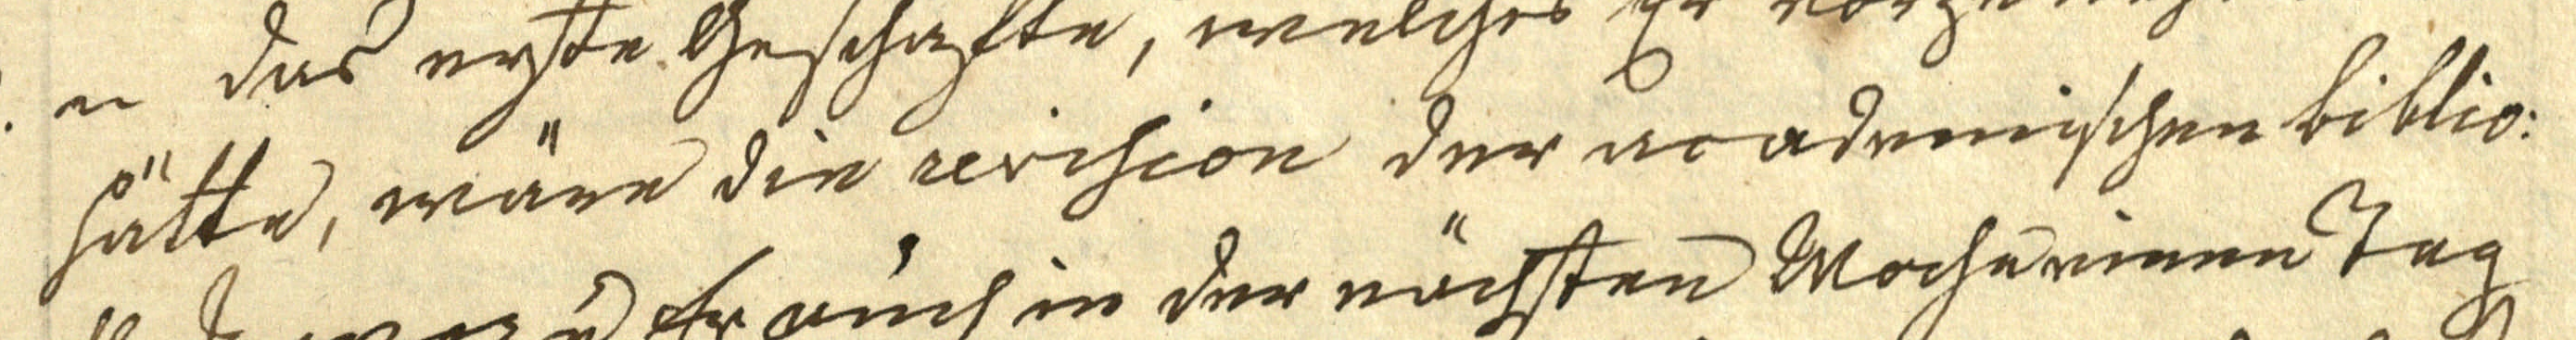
hätte, wäre die revision der academischen Biblio¬
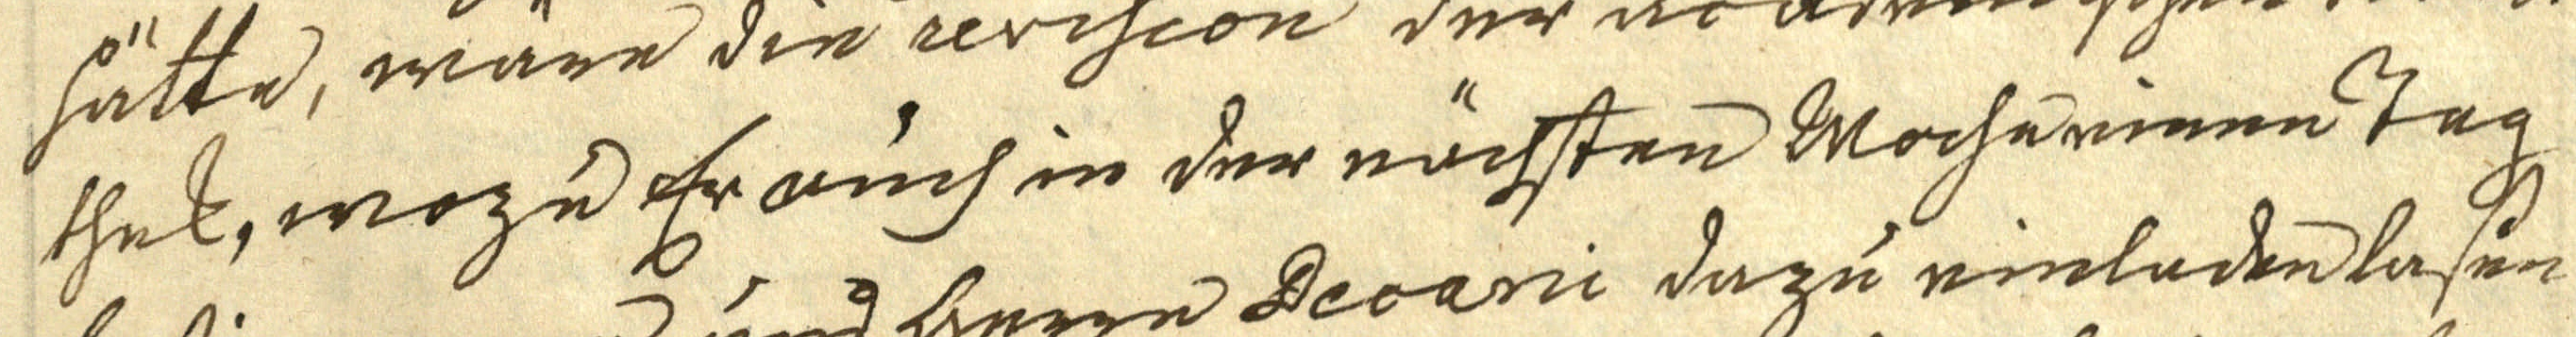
thek, wozu Er auch in der nächsten Woche einen Tag
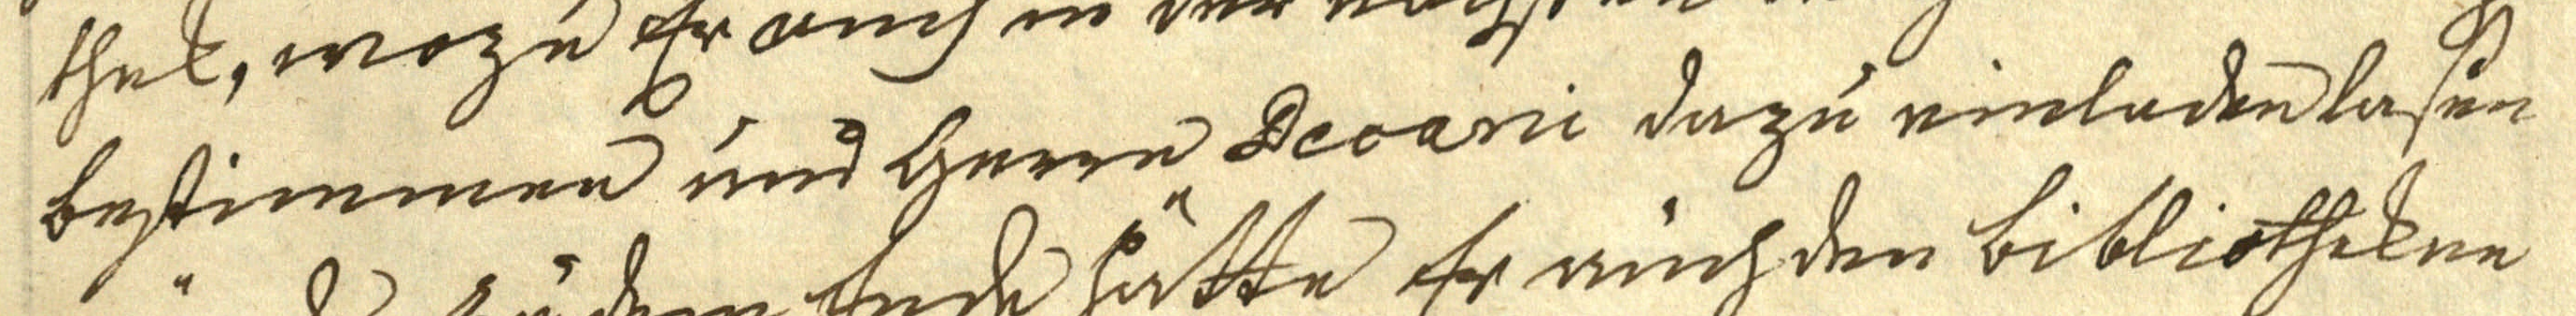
bestimmen und Herrn Decani dazu einladen laßen
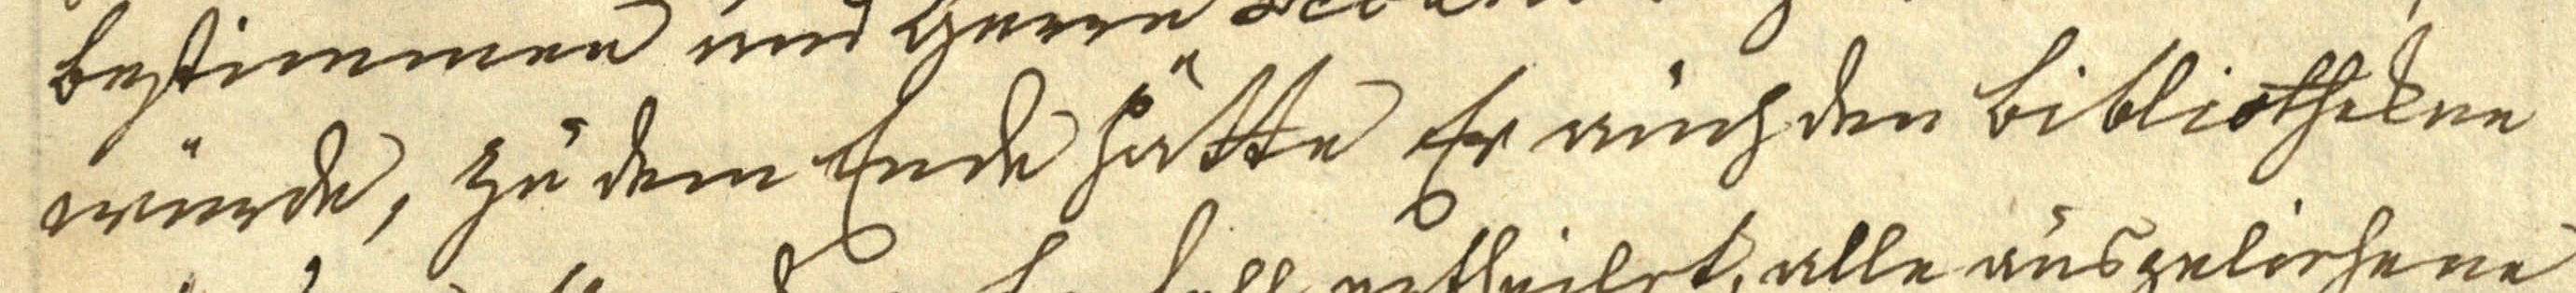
würde, zu dem Ende hätte Er auch dem Bibliotheken¬
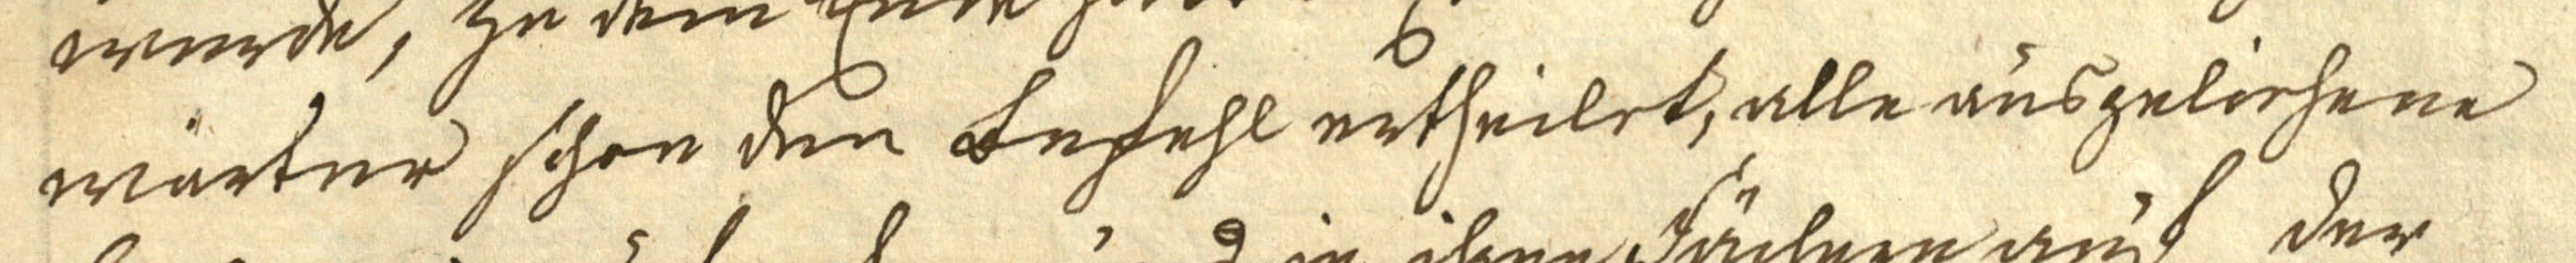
wärter schon den Befehl ertheilet, alle aus geliehene
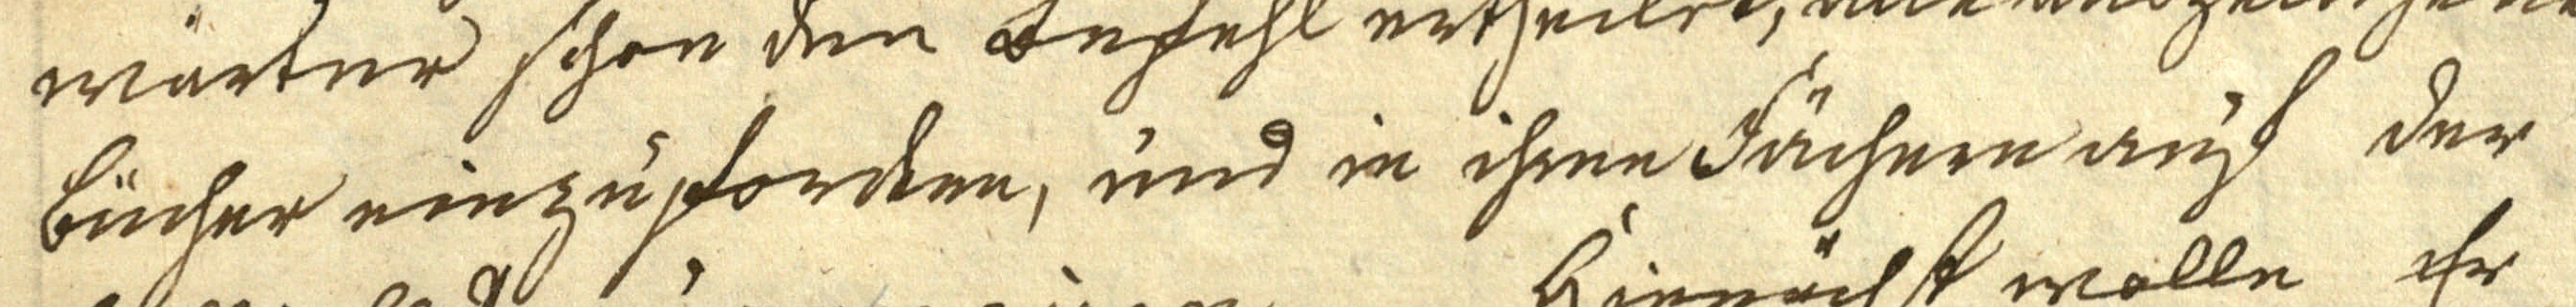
Bücher einzufordern, und in ihren Fächern auf der
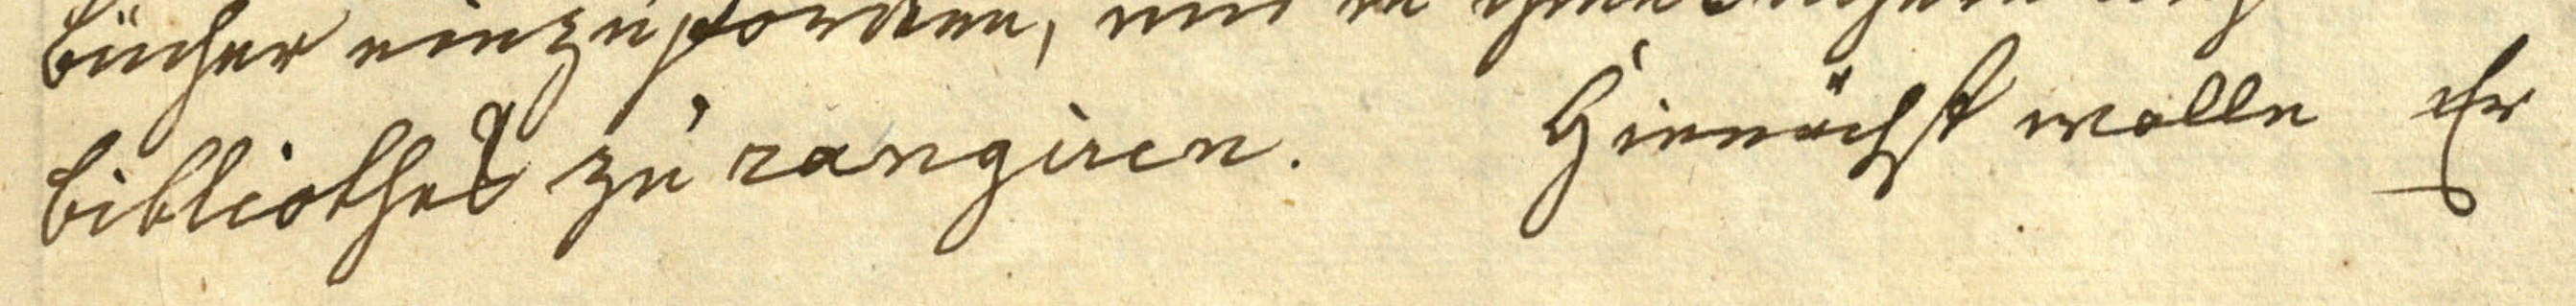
Bibliothek zu rangiren Hienächst wolle Er
